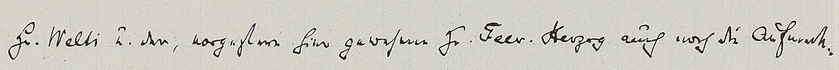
Hr. Welti u. der, vorgestern hier gewesene Hr. Feer-Herzog auch noch die Aufmerk-
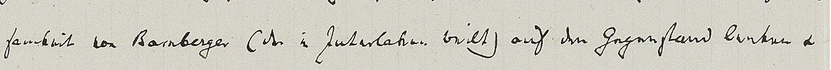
samkeit von Bamberger (der in Interlaken weilt) auf den Gegenstand lenken &
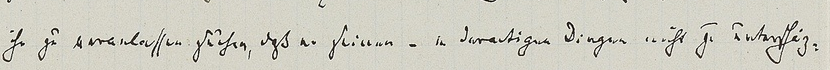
ihn zu veranlassen suchen, daß er seinen – in derartigen Dingen nicht zu unterschät-
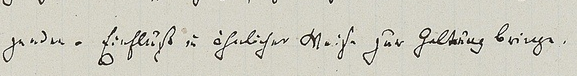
zenden – Einfluß in ähnlicher Weise zur Geltung bringe.
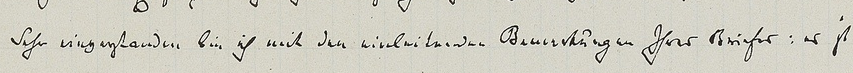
Sehr einverstanden bin ich mit den einleitenden Bemerkungen Ihres Briefes: es ist
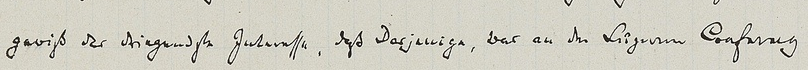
gewiß das dringendste Interesse, daß Dasjenige, was an der Luzerner Conferenz
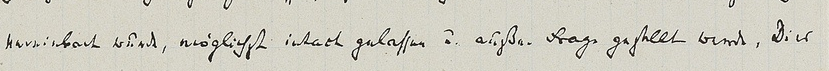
vereinbart wurde, möglichst intact gelassen u. außer Frage gestellt werde. Dies
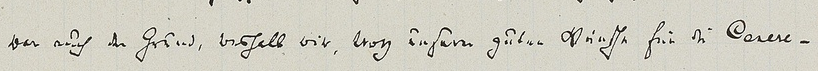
war auch der Grund, weshalb wir, troz unsrer guten Wünsche für die Cenere -
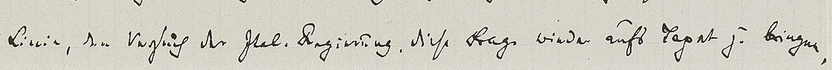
Linie, den Versuch der Ital. Regierung, diese Frage wieder aufs Tapet zu bringen,
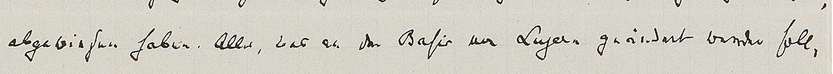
abgewiesen haben. Alles, was an der Basis von Luzern geändert werden soll,
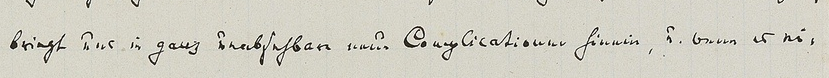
bringt uns in ganz unabsehbare neue Complicationen hinein, u. wenn es nö-
